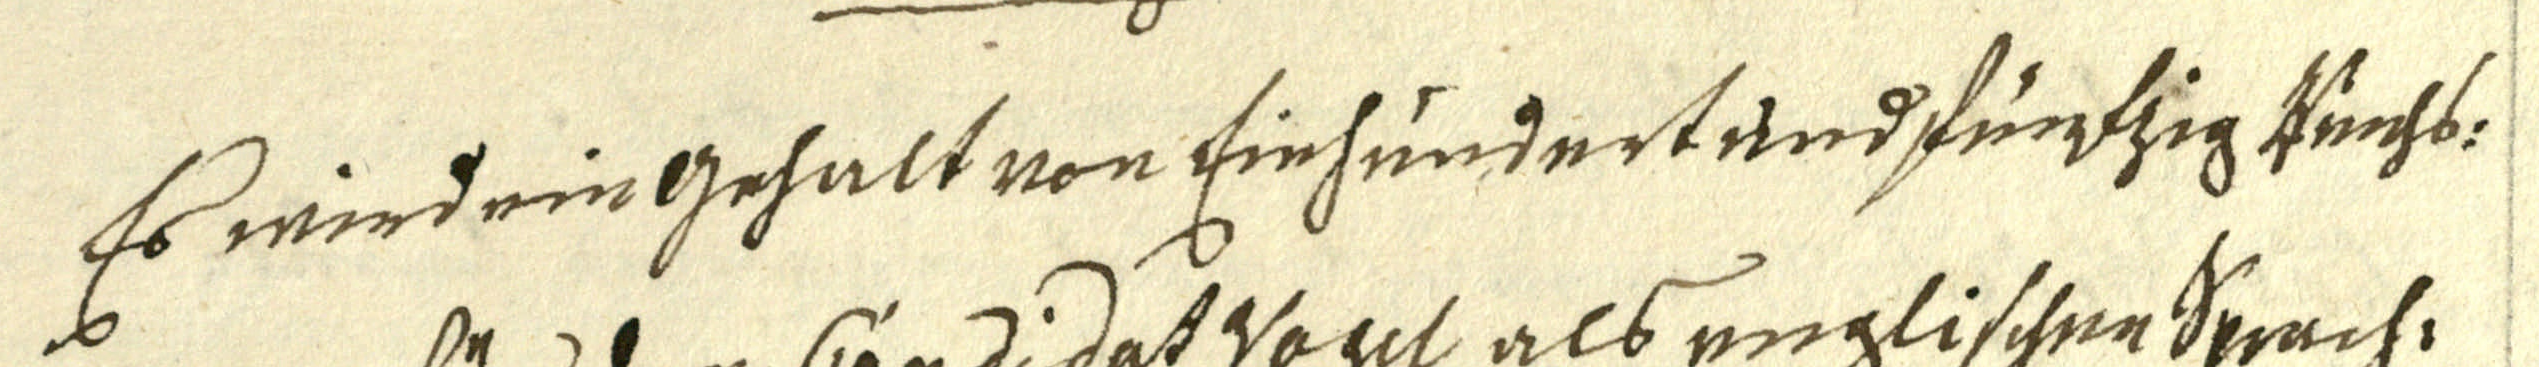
Es wird ein Gehalt von Einhundertundfünfzig Reichs¬
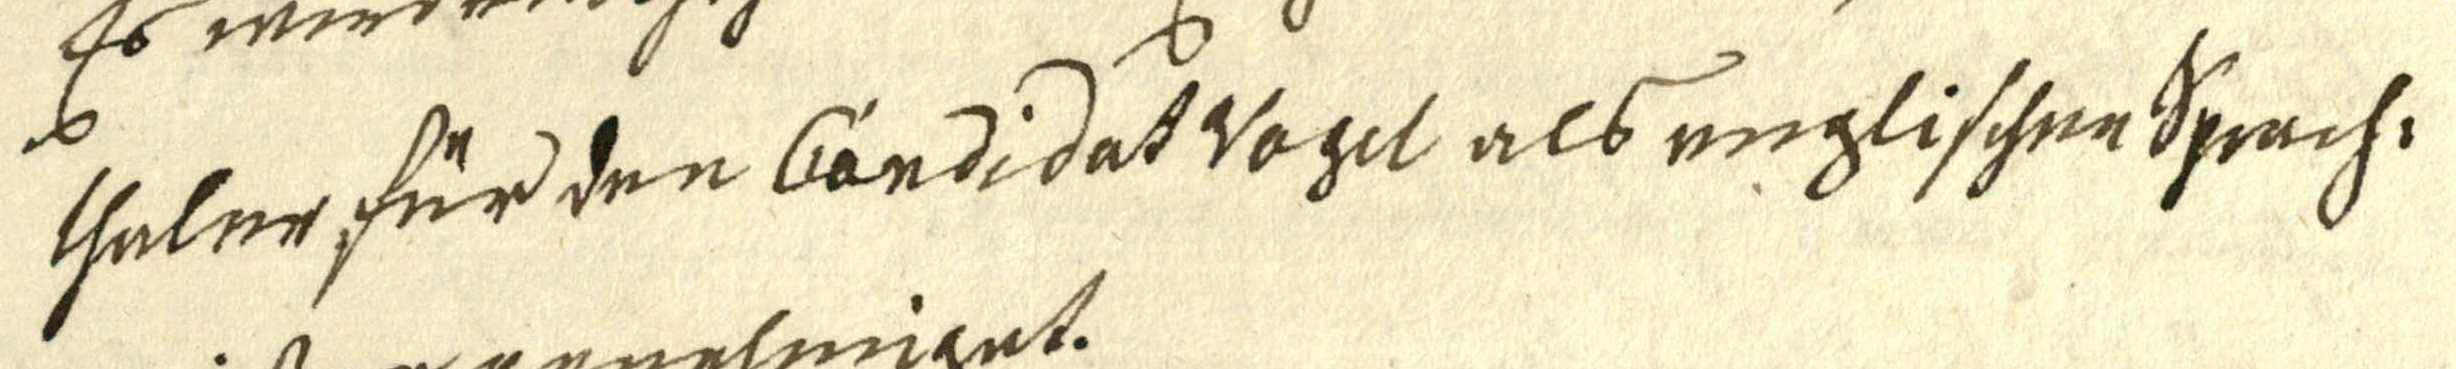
thaler für den Candidat Vogel als englischen Sprach¬
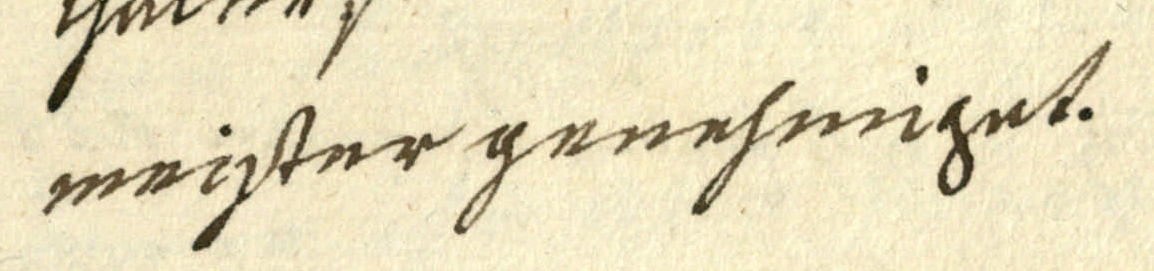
meister genehmiget¬
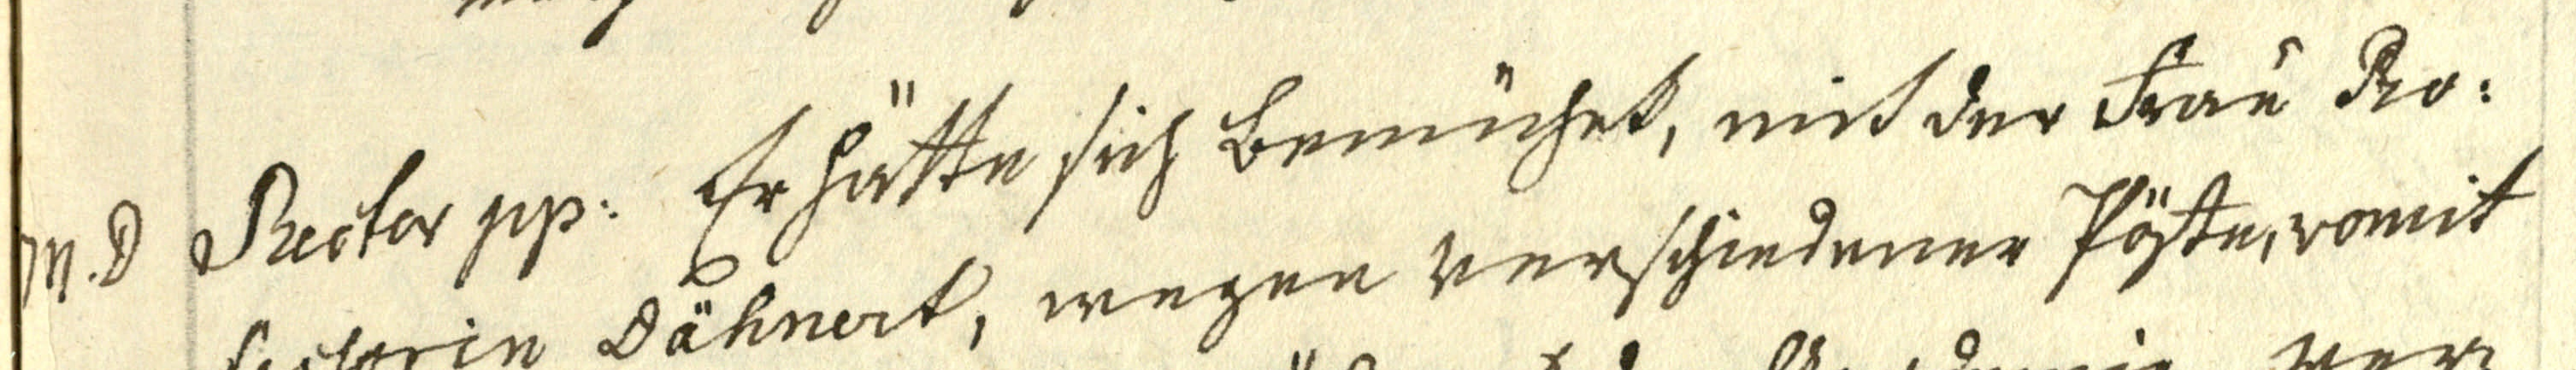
M. D Rector pp. Er hätte sich bemühet, mit der Frau Pro¬
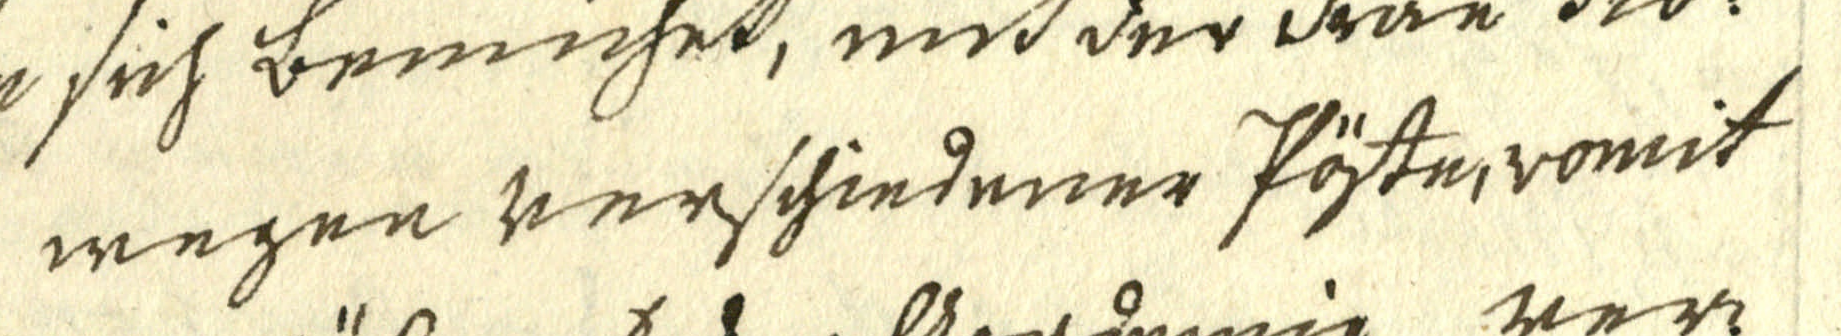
fessorin Dähnert wegen verschiedener Pöste, womit
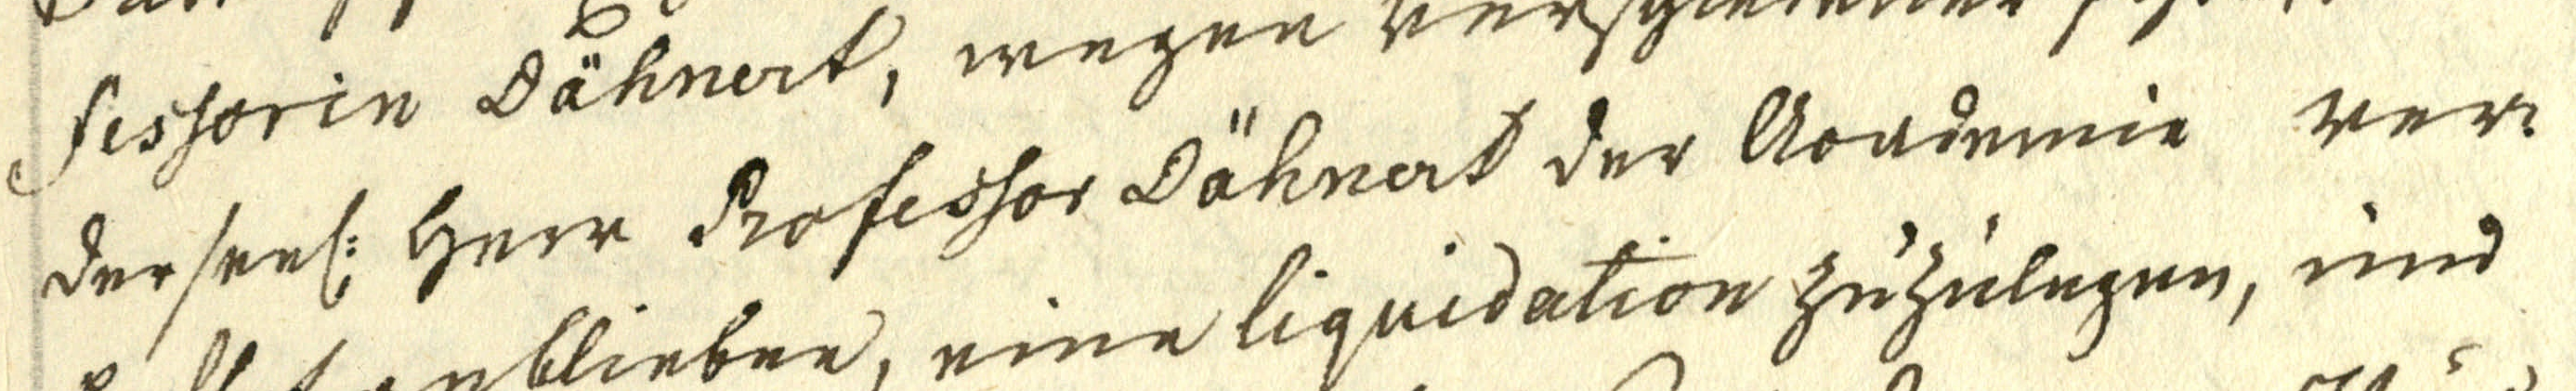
der seel. Herr Professor Dähnert der Academie ver¬
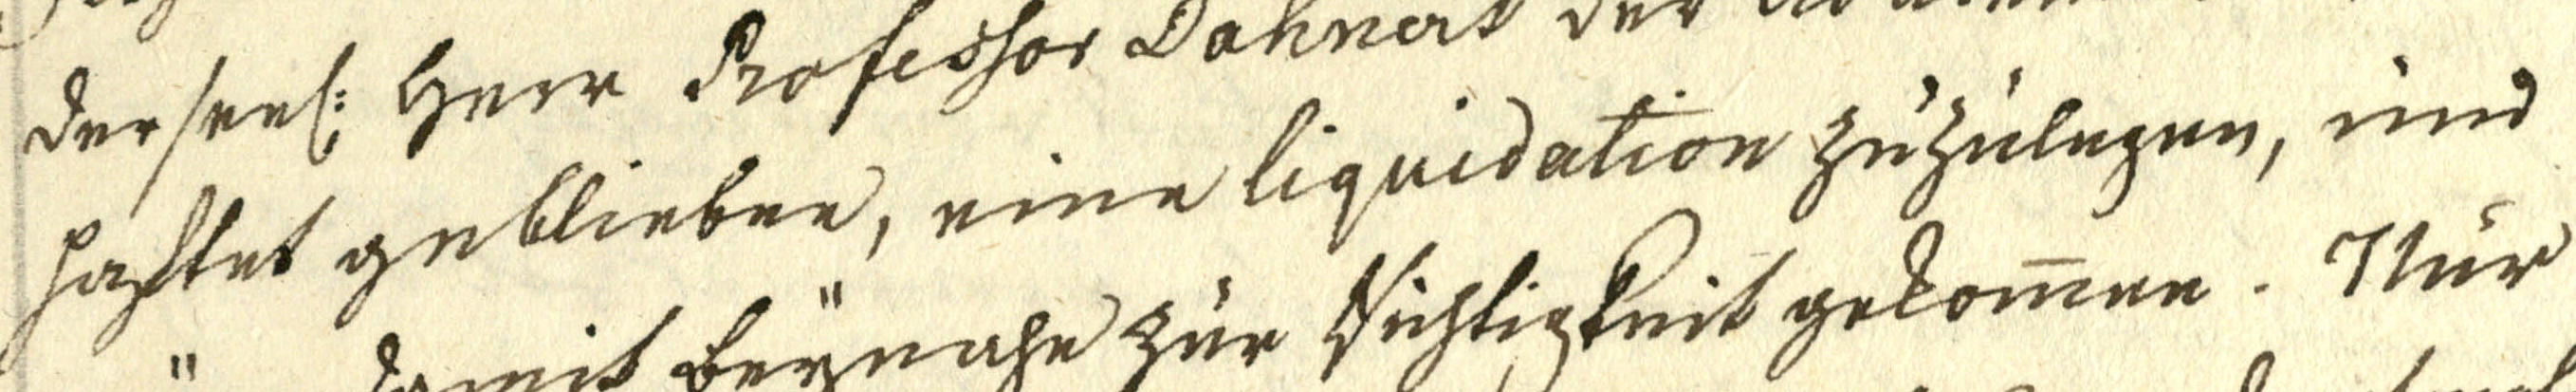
haftet geblieben, eine liquidation zuzulegen, und
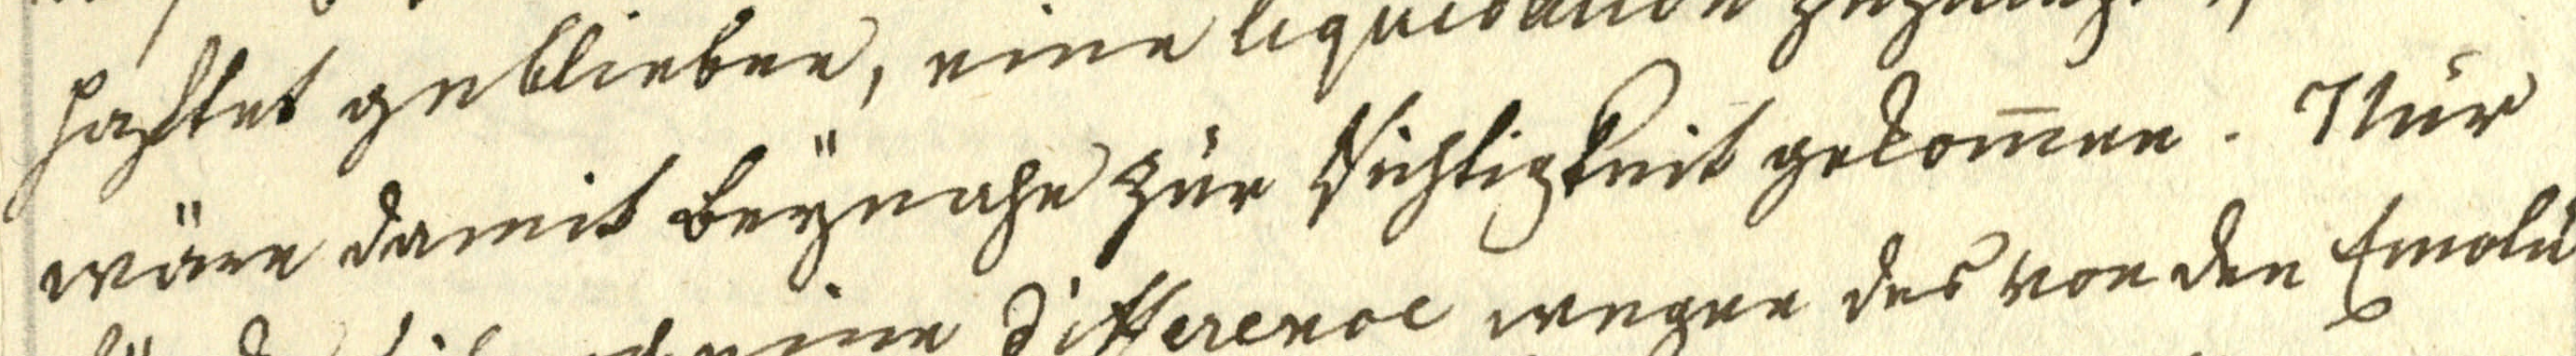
wäre damit beÿnahe zur Richtigkeit gekomen. Nur
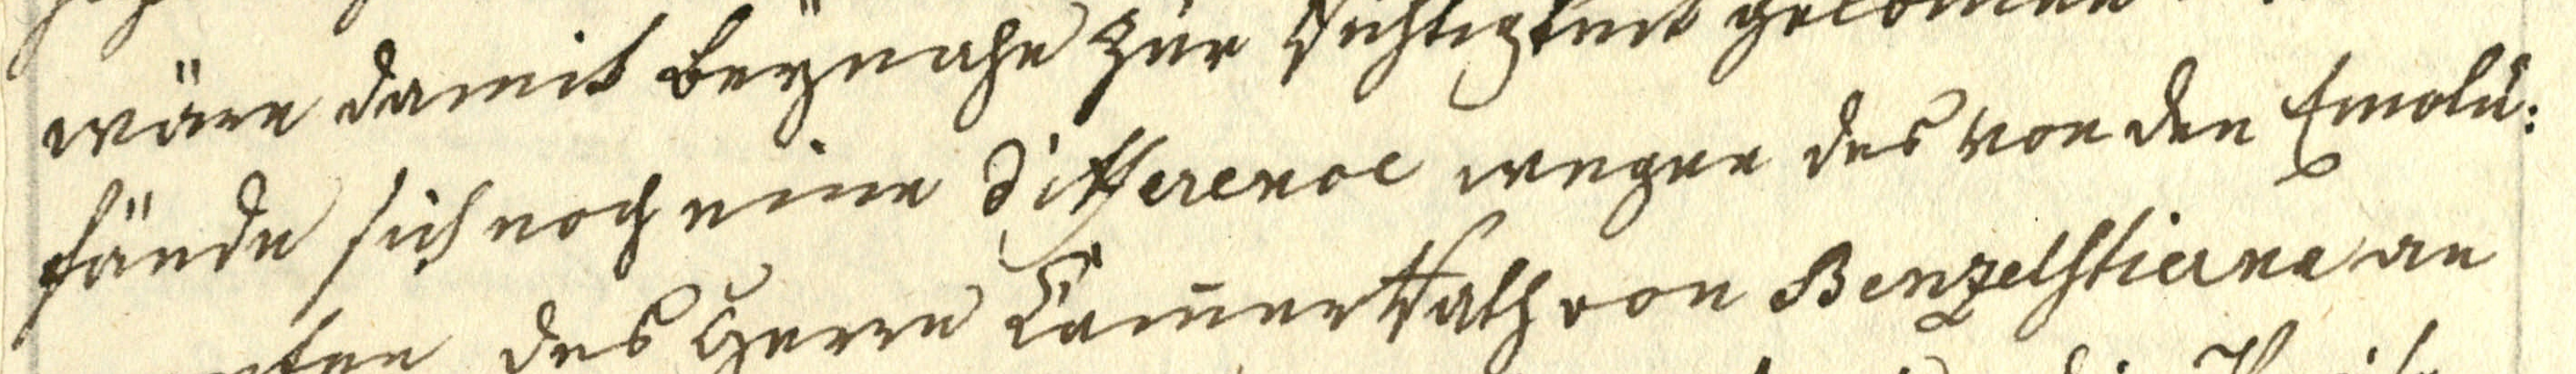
fände sich noch eine difference wegen des von den Emolu¬
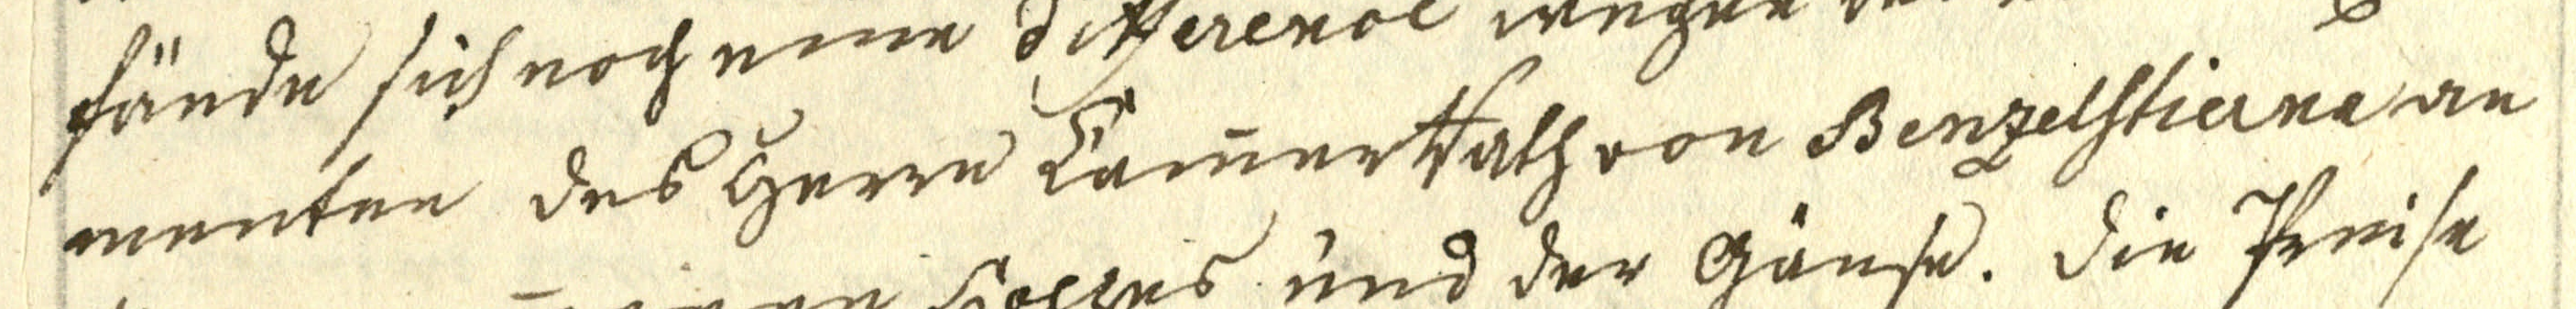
menten des Herrn CamerRath von Benzelstierna an
